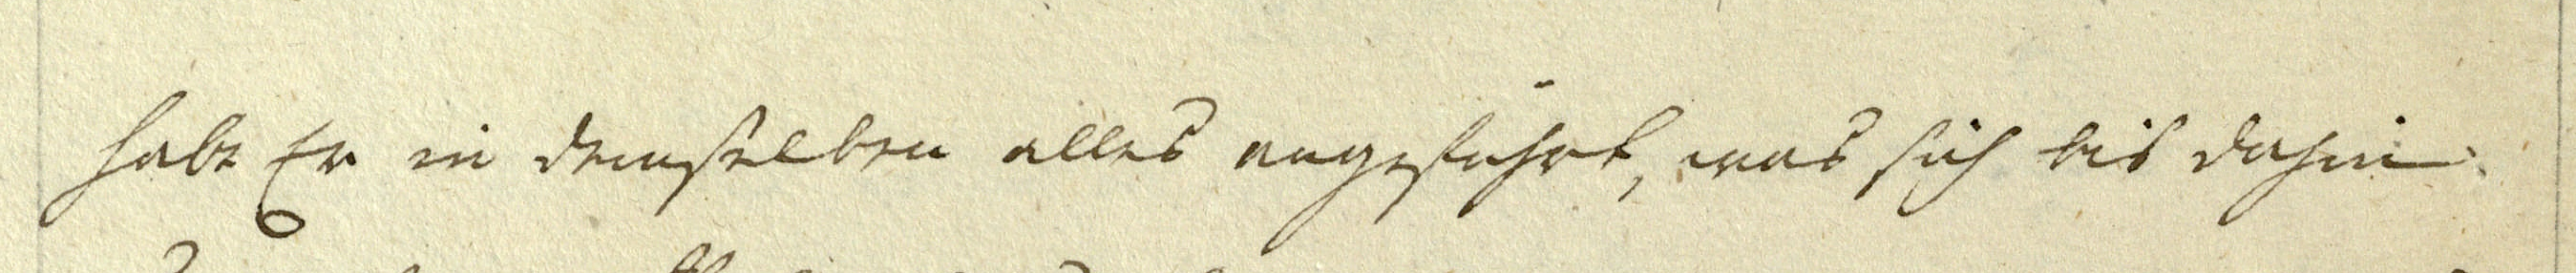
habe Er in demselben alles angeführt, was sich bis dahin
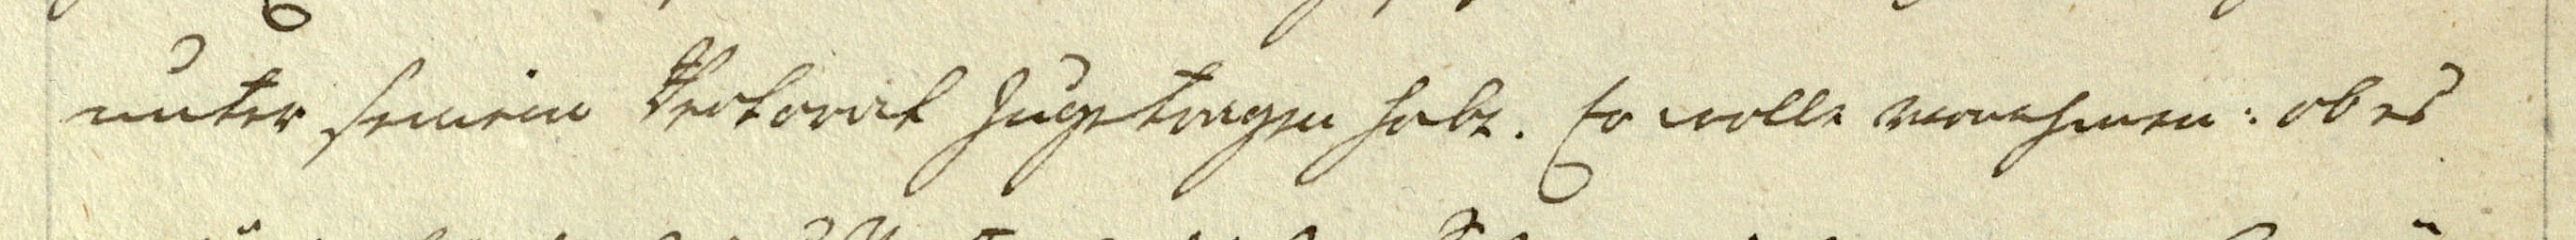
unter seinem Rectorat zugetragen habe. Er wolle vornehmen: ob es
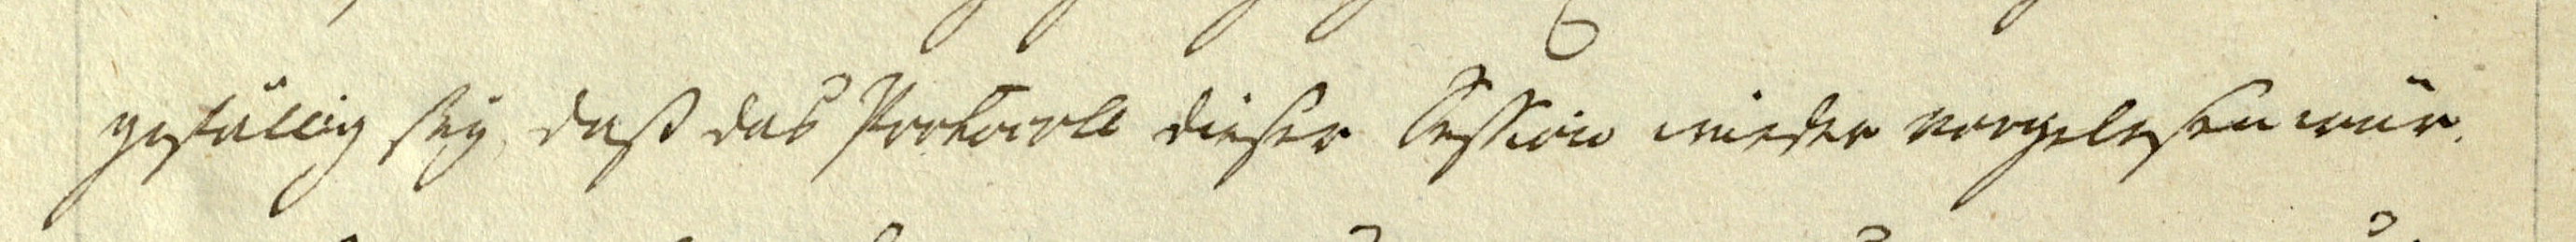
gefällig seÿ daß das Protocoll dieser Session wieder vorgelesen wür¬
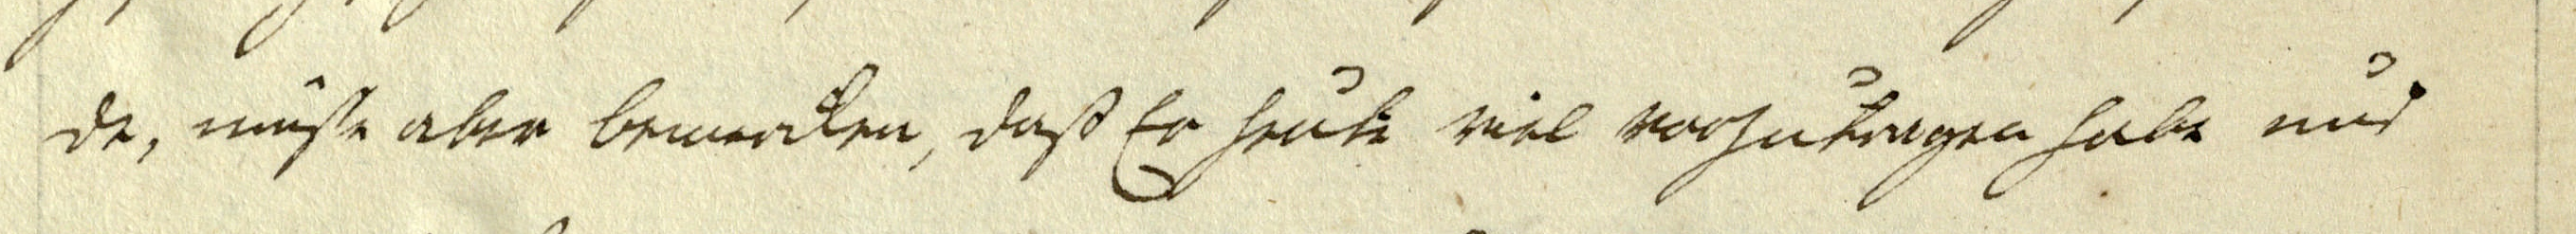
de, müsse aber bemercken, daß Er heute viel vorzutragen habe und
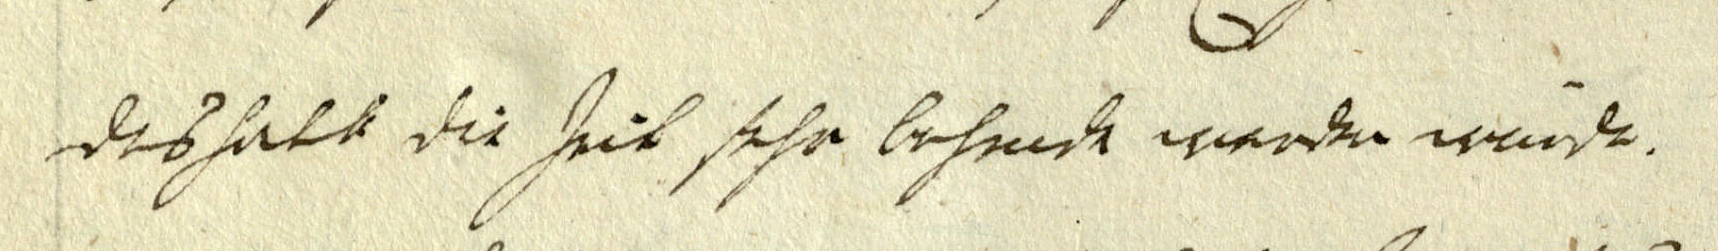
deshalb die Zeit sehr behende werden würde.
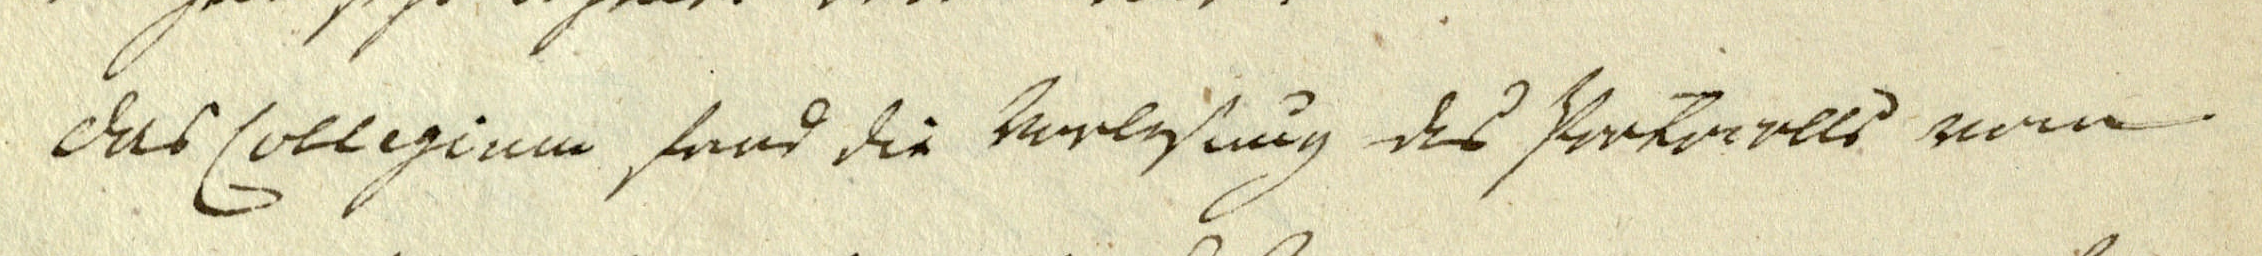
Das Collegium fand die Vorlesung des Protocolls vom
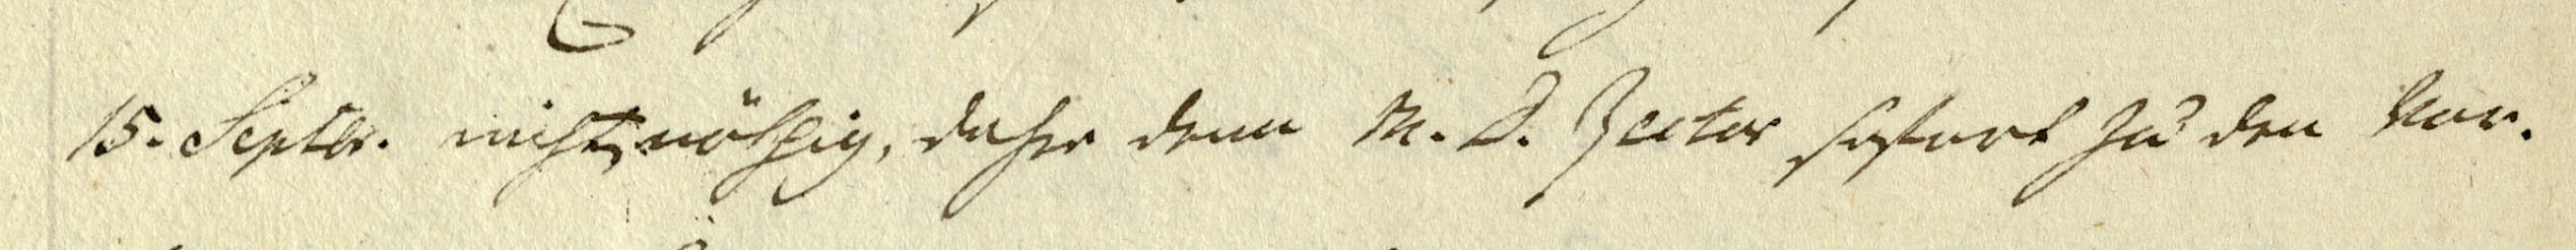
15. Septbr. nichtnöthig, daher denn M. D. Rector sofort zu den Vor¬
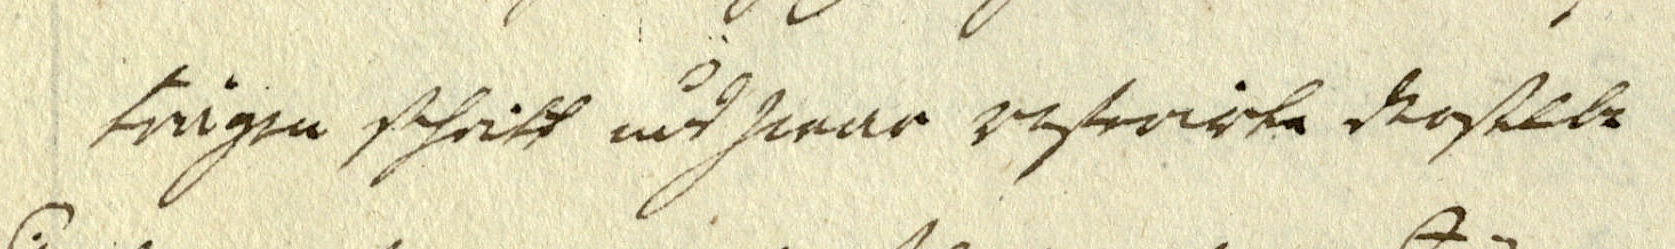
trägen schritt und zwar referirte derselbe
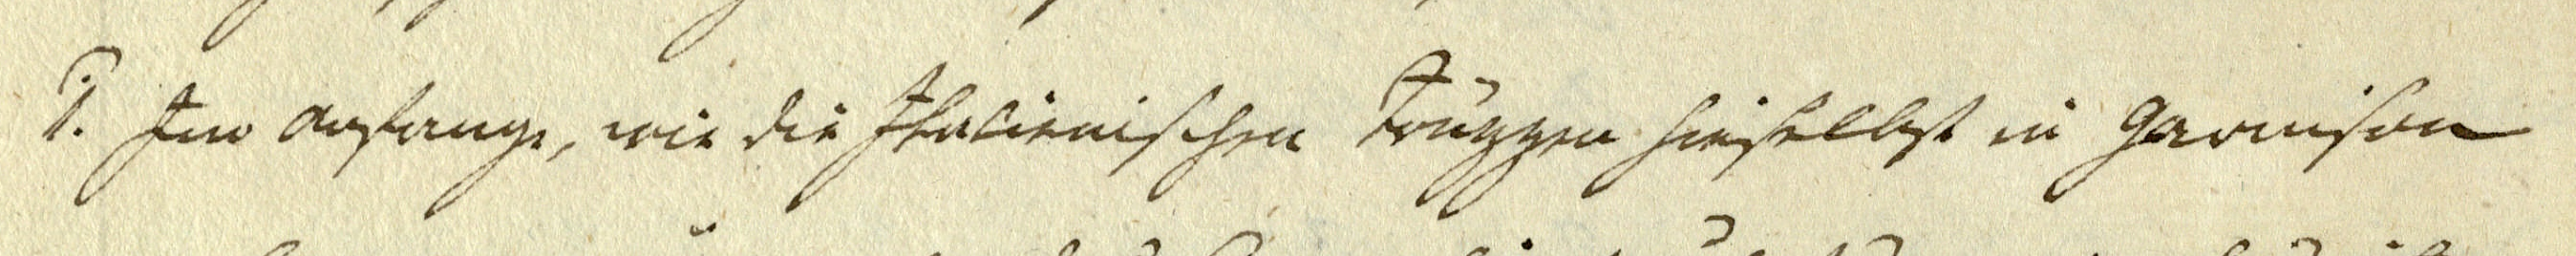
1. Im Anfange, wie die Italienischen Truppen hieselbst in Garnison
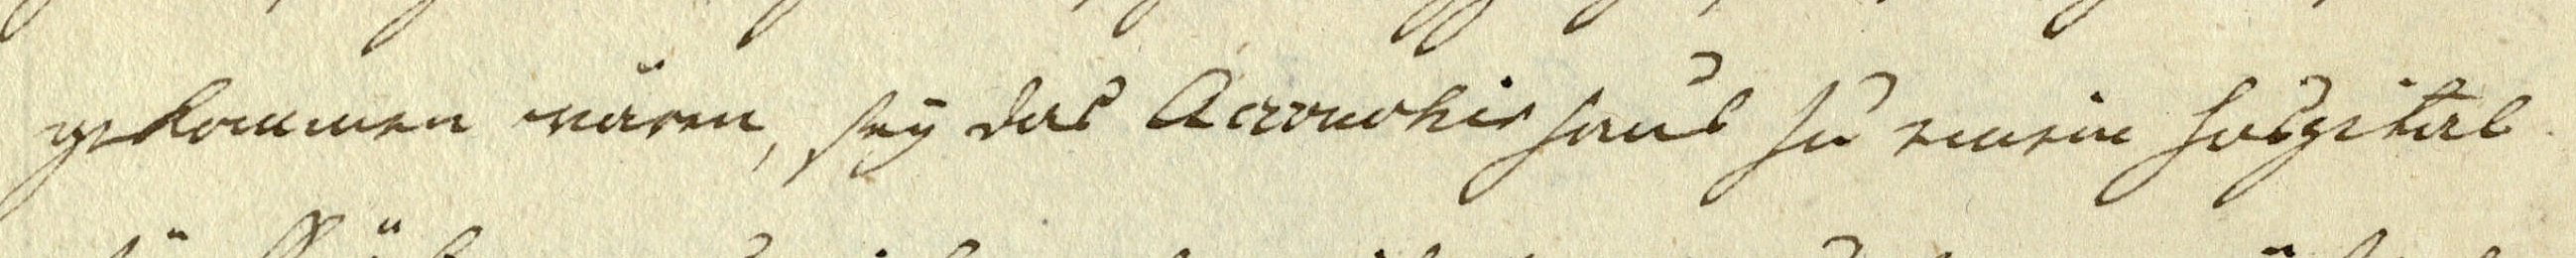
gekommen wären, seÿ das Accourhirhaus zu einem Hospital
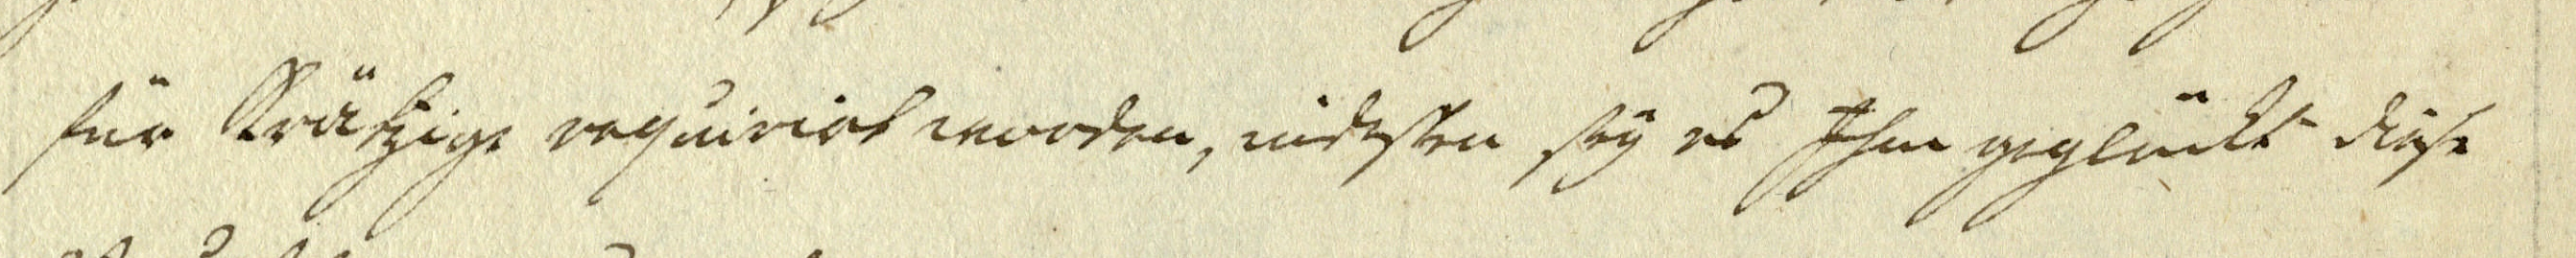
für Krätzige requirirt worden, indessen seÿ es Ihm geglückt diese
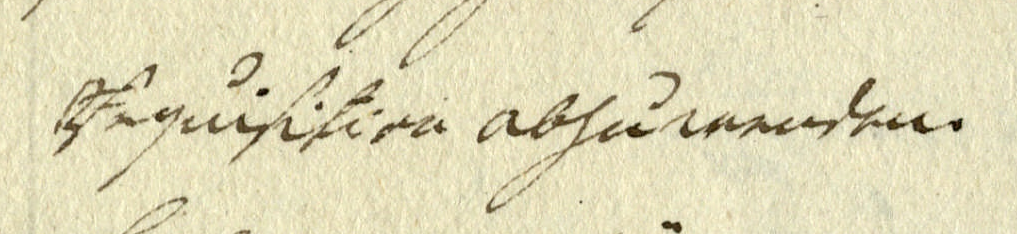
Requisition abzuwenden.
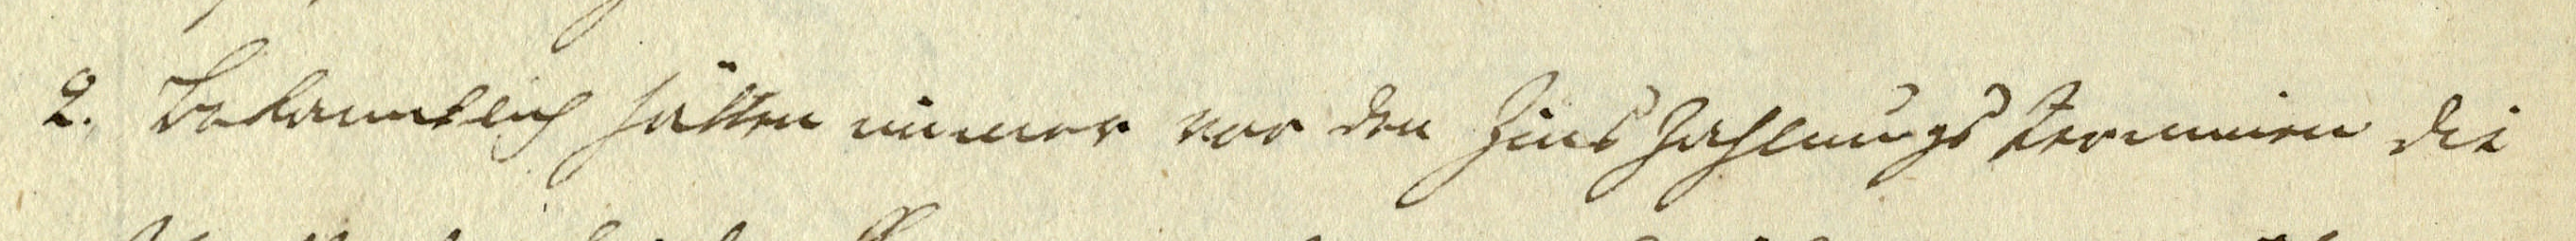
2. Bekanntlich hätten immer vor den Zinszahlungsterminen die
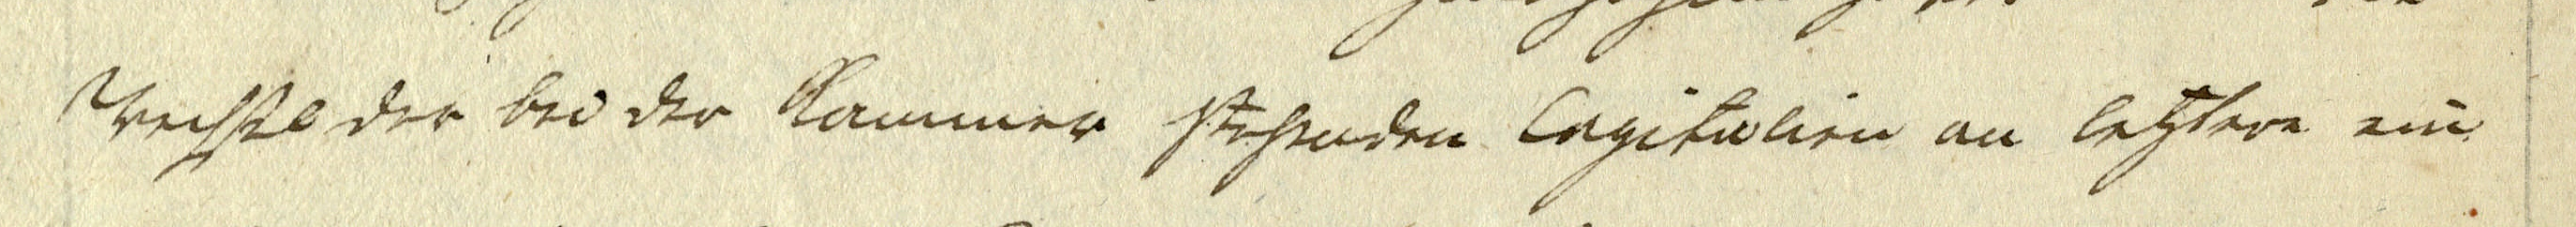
Wechsel der bei der Kammer stehenden Capitalien an letztere ein¬
